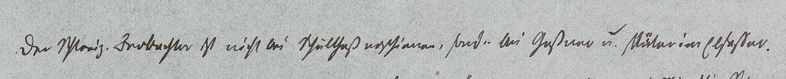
Der Schweiz. Beobachter ist nicht bei Schultheß erschienen, sond. bei Geßner u. später im Elsasser.
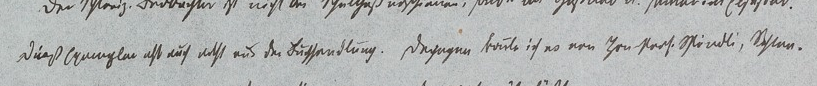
Dieß Exemplar ist auch nicht aus der Buchhandlung. Dagegen konnte ich es von Hrn Prof. Spöndli, Schwa-
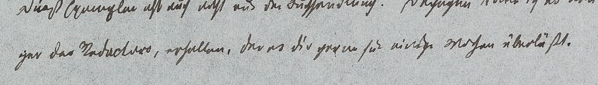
ger des Redactors, erhalten, der es dir gerne für einige Wochen überläßt.
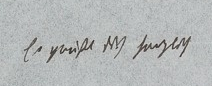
Es grüßt dich herzlich
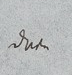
dein
